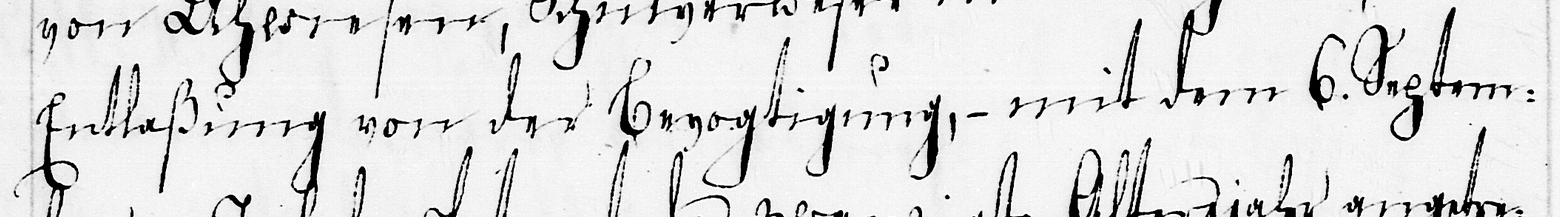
Entlaßung von der Bevogtigung, – mit dem 6. Septem¬
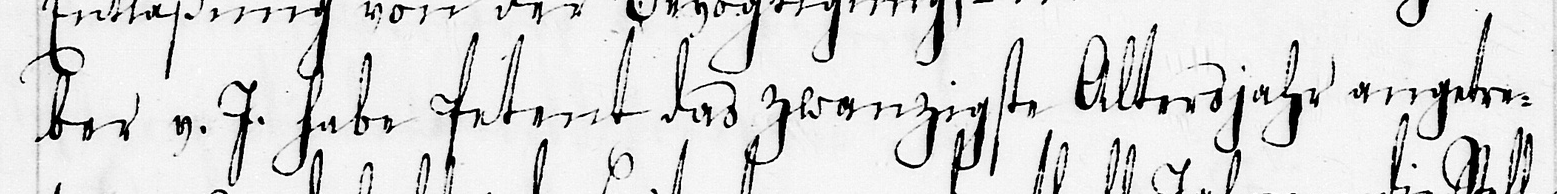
ber v. J. habe Petent das zwanzigste Altersjahr angetre¬
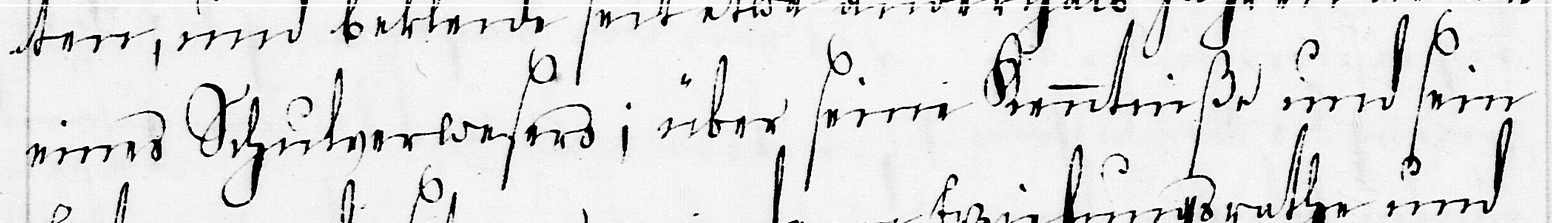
eines Schulverwesers; über seine Kenntniße und sein
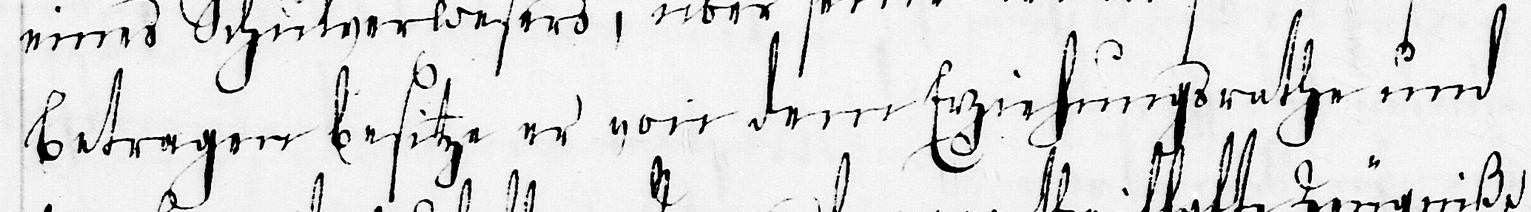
Betragen besitze er von dem Erziehungsrathe und
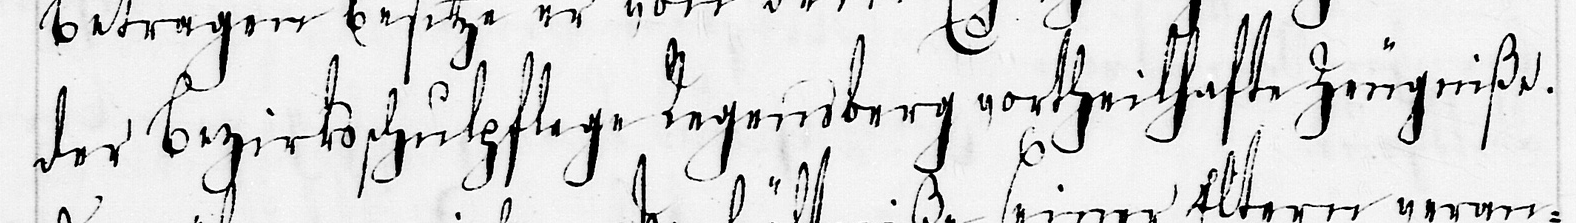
der Bezirksschulpflege Regensberg vortheilhafte Zeugniße.
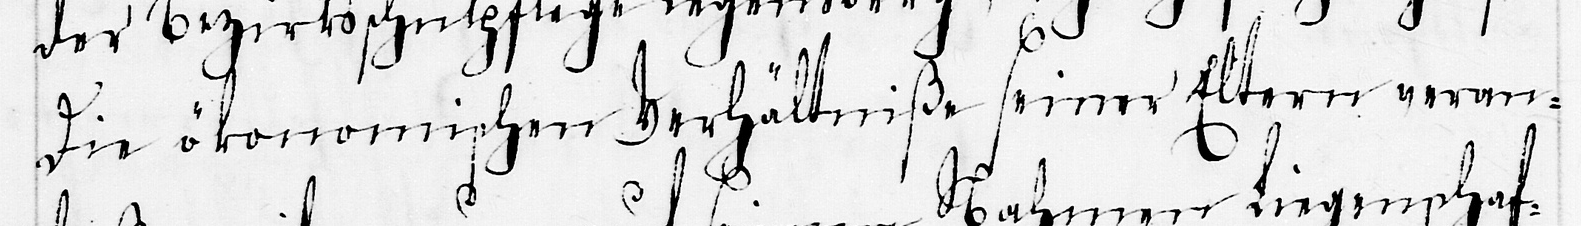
Die ökonomischen Verhältniße seiner Eltern veran¬
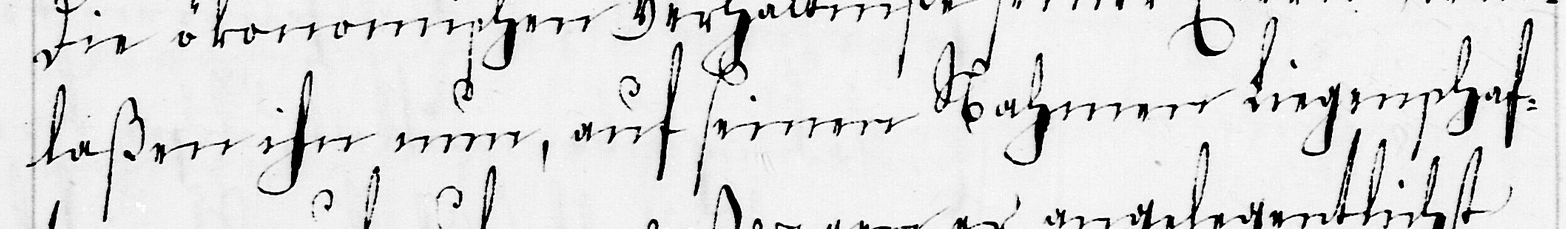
laßen ihn nun, auf seinen Nahmen Liegenschaf¬
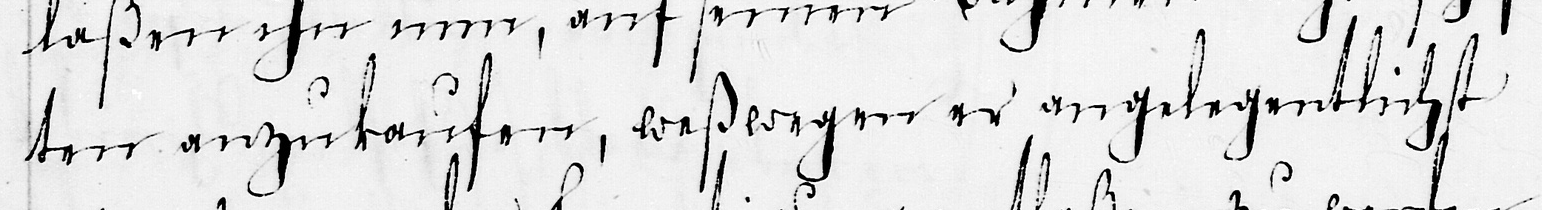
ten anzukaufen, weßwegen er angelegentlichst
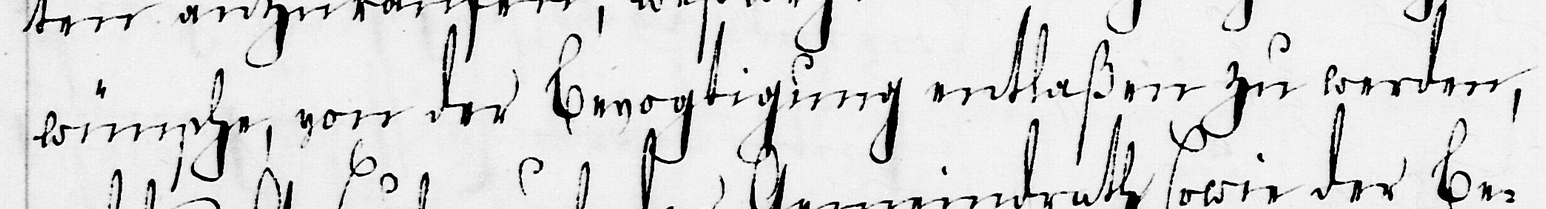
wünsche, von der Bevogtigung entlaßen zu werden,
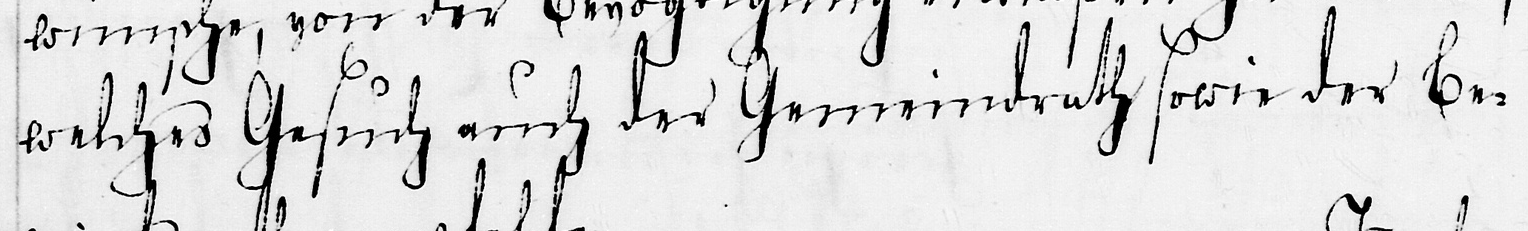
welches Gesuch auch der Gemeindrath sowie der Be¬
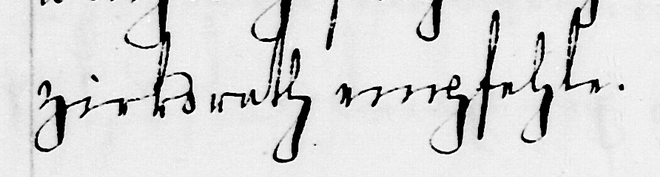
zirksrath empfehle.
